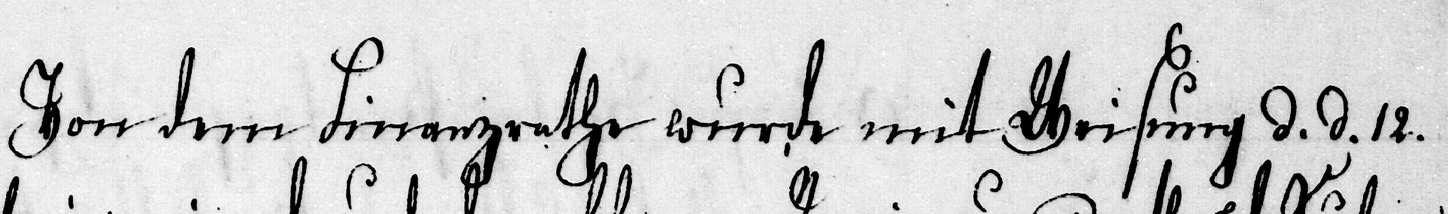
Von dem Finanzrathe wurde mit Weisung d. d. 12.
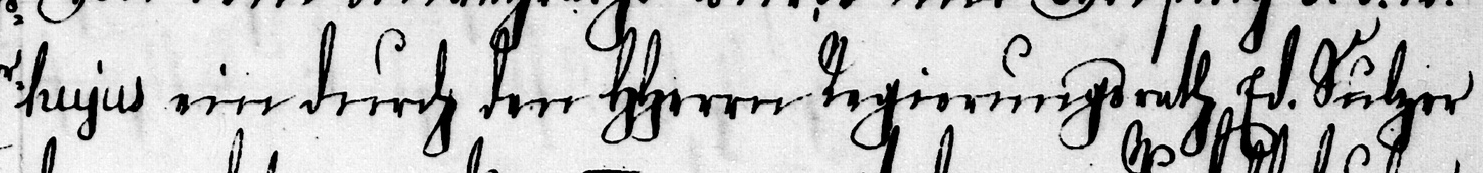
hujus ein durch den HHerrn Regierungsrath Ed. Sulzer
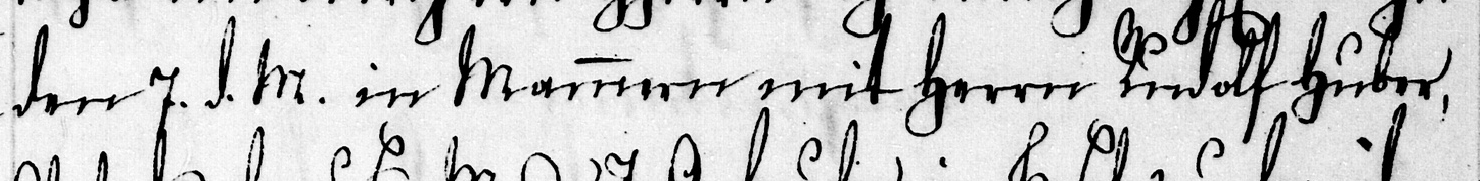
den 7. d. M. in Mammern mit Herrn Rudolf Huber,
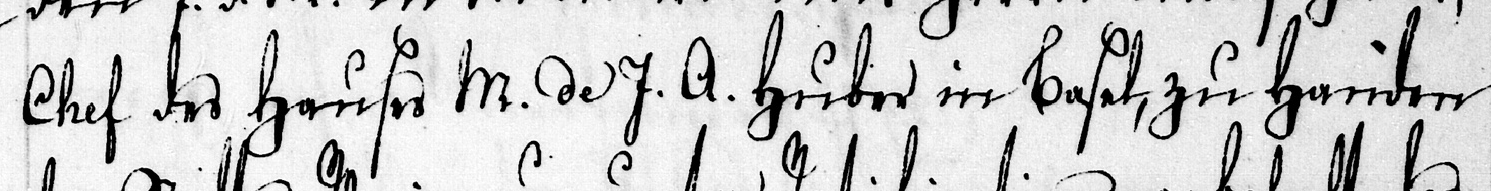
Chef des Hauses M. de J. A. Huber in Basel, zu Handen
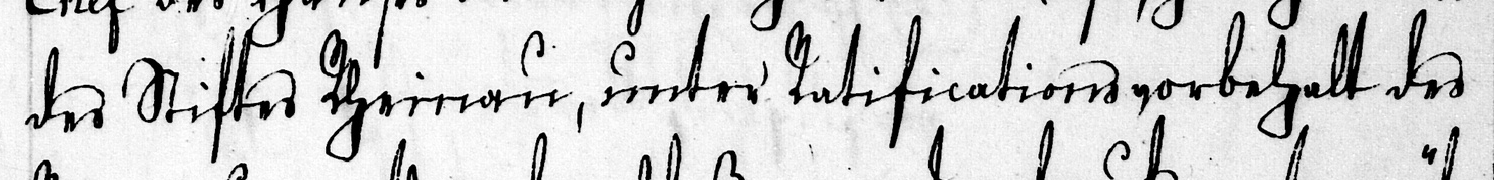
des Stiftes Rheinau, unter Ratificationsvorbehalt des
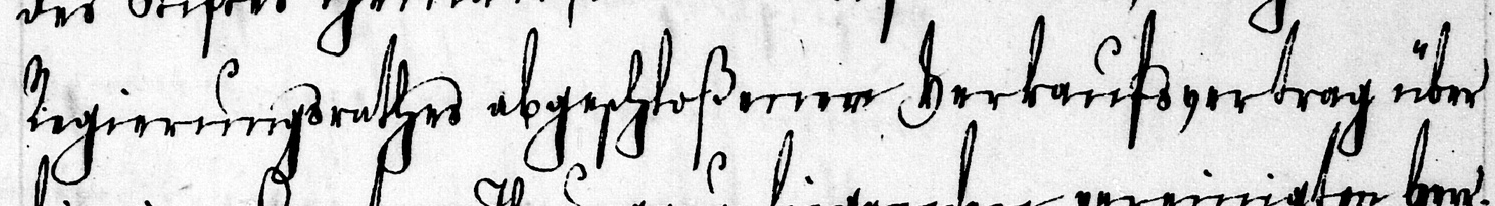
Regierungsrathes abgeschloßenen Verkaufsvertrag über
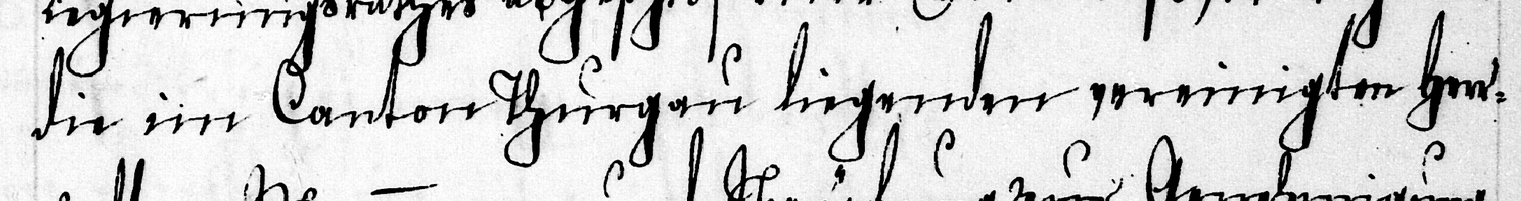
die im Canton Thurgau liegenden vereinigten Herr¬
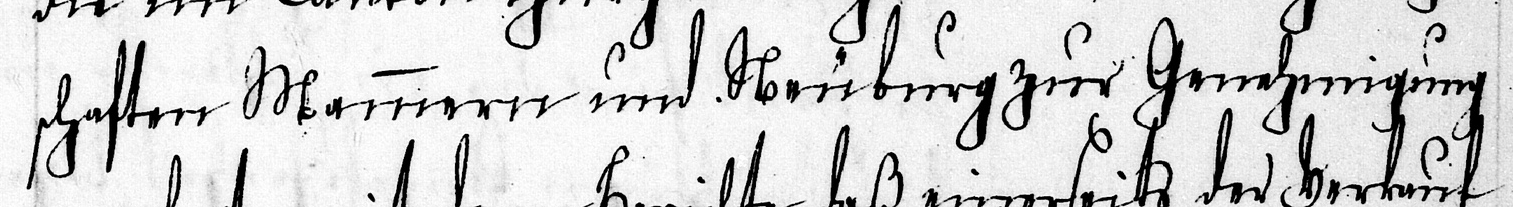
schaften Mammern und Neuburg zur Genehmigung
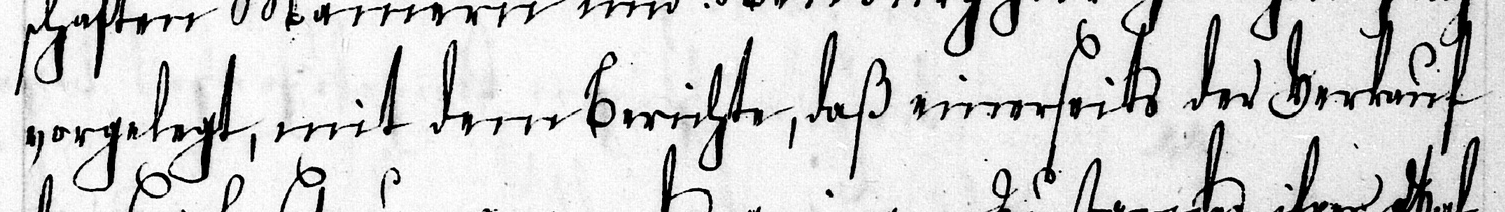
vorgelegt, mit dem Berichte, daß einerseits der Verkauf
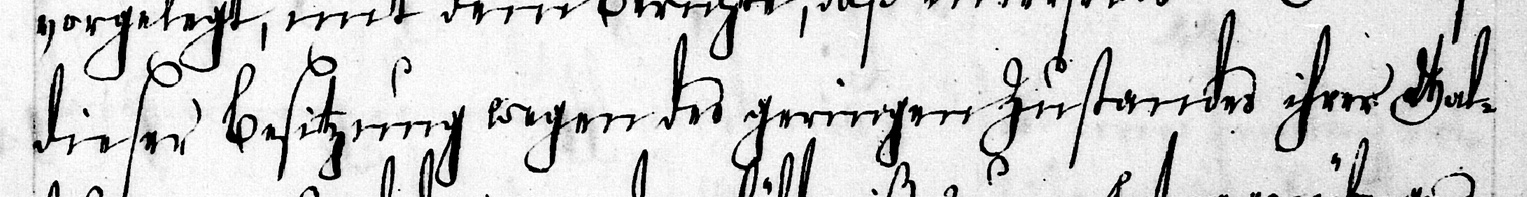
dieser Besitzung wegen des geringen Zustandes ihrer Wal¬
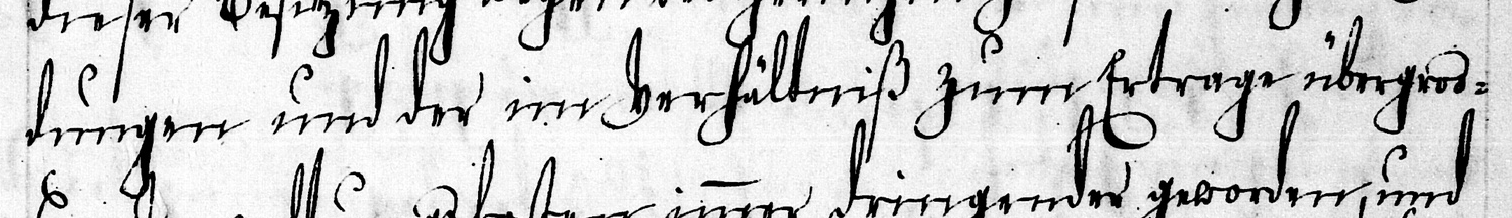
dungen und der im Verhältniß zum Ertrage übergroß¬
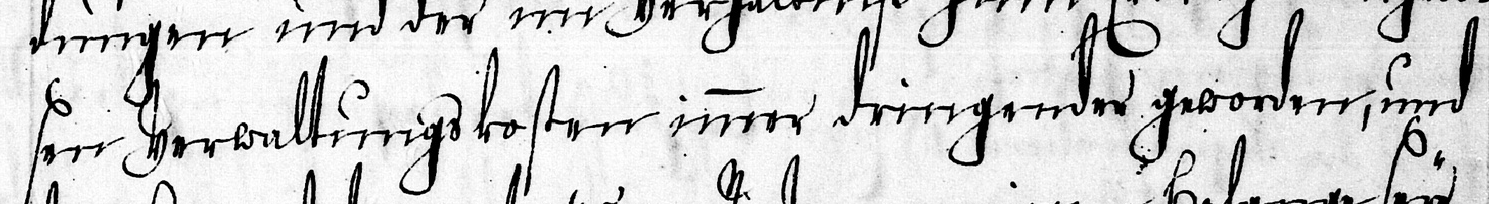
en Verwaltungskosten immer dringender geworden, und
